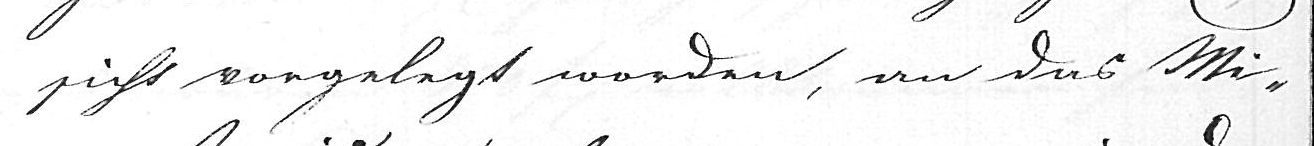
sicht vorgelegt worden, an das Mi-
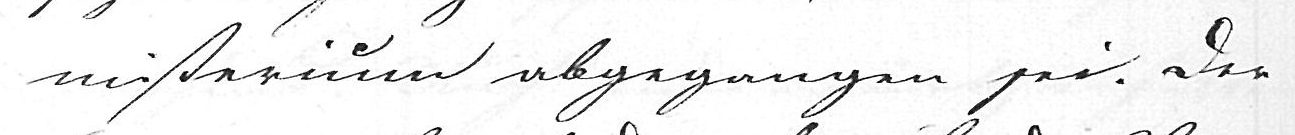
nisterium abgegangen sei. Der
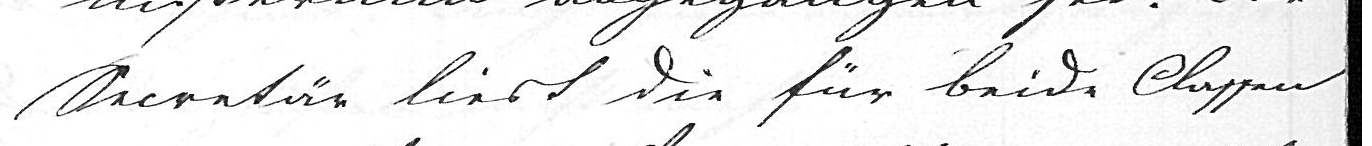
Secretär liest die für beide Classen
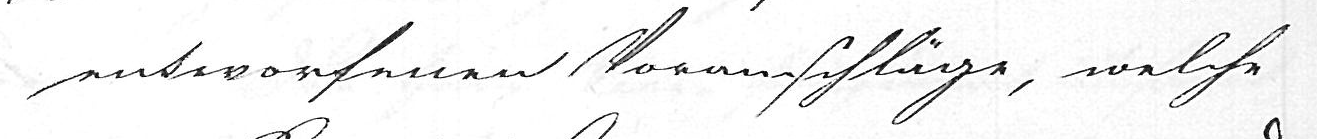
entworfenen Voranschläge, welche
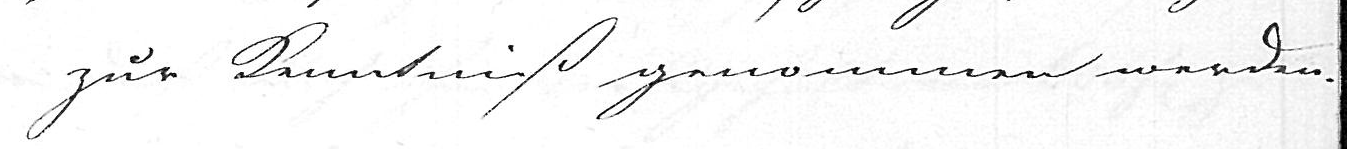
zur Kenntniß genommen werden.
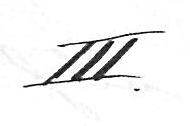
III.
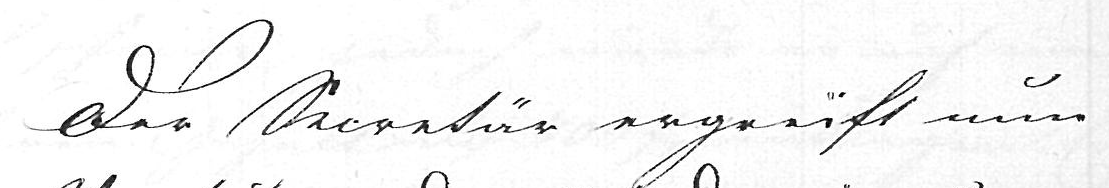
Die Secretär ergreift nun
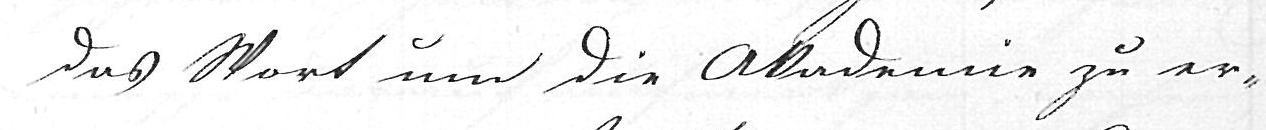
das Wort um die Akademie zu er-
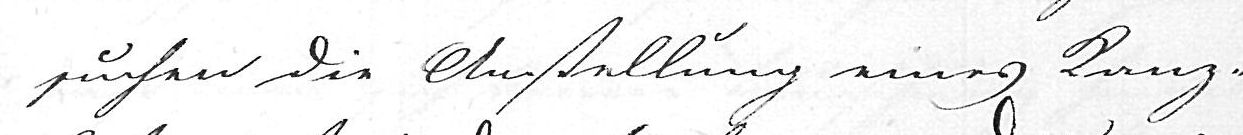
suchen die Anstellung eines Kanz-
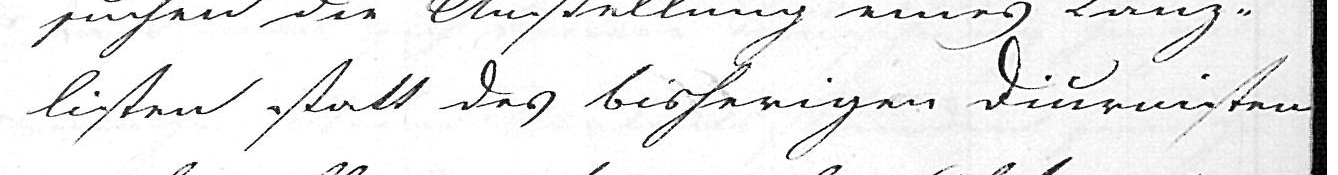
listen statt des bisherigen Diurnisten
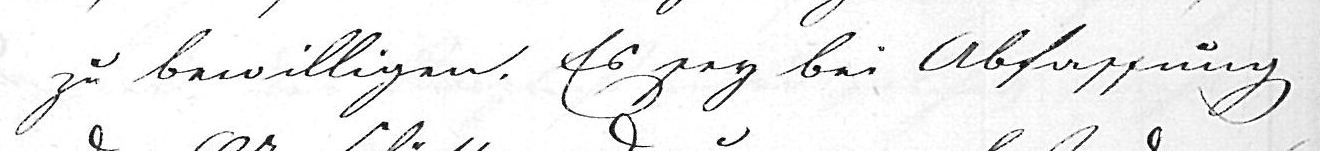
zu bewilligen. Es sey bei Abfassung
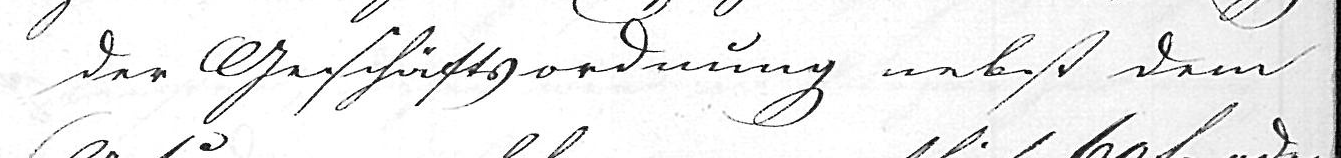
der Geschäftsordnung nebst dem
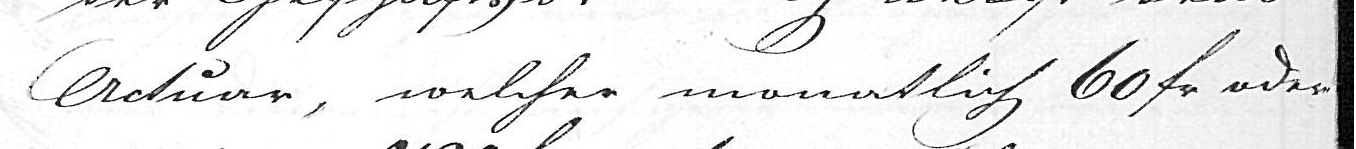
Actuar, welcher monatlich 60 fl oder
